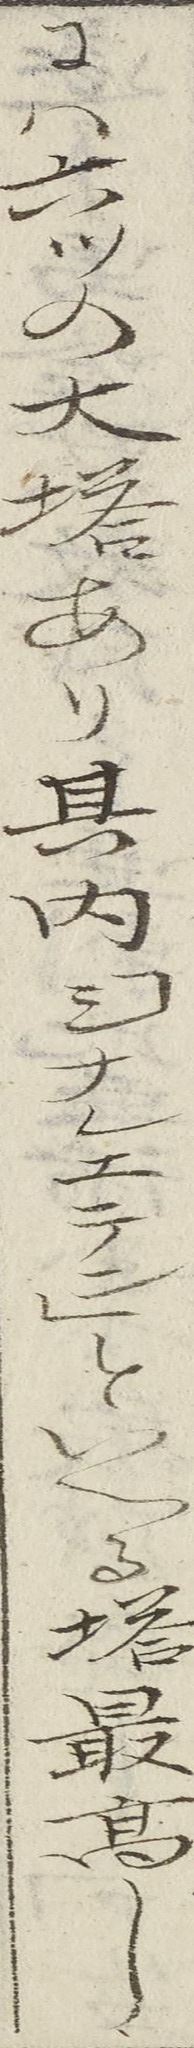にハ六ッの大搭ありその内「シナレエテン」といへる搭最高し
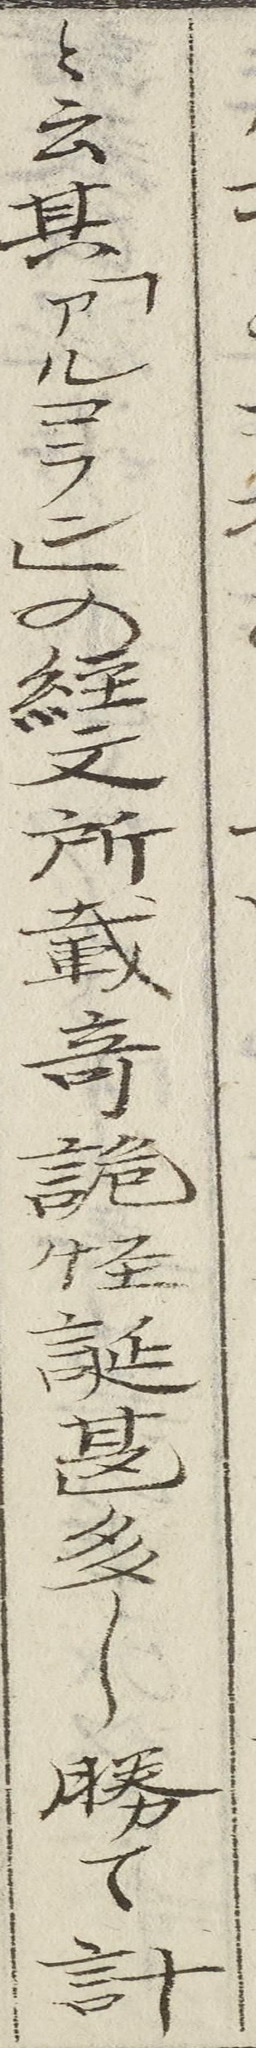と云其「アルコラン」の経文所載奇詭怪誕甚多し勝て計
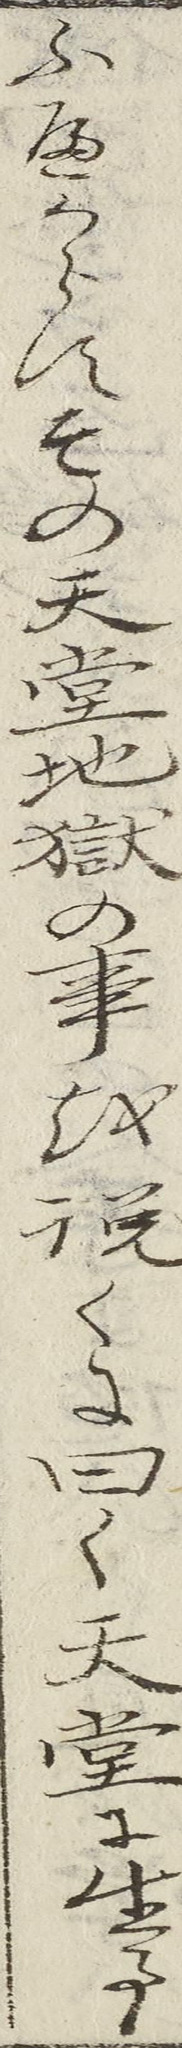ふへからすその天堂地獄の事を説くに曰く天堂に生るゝ
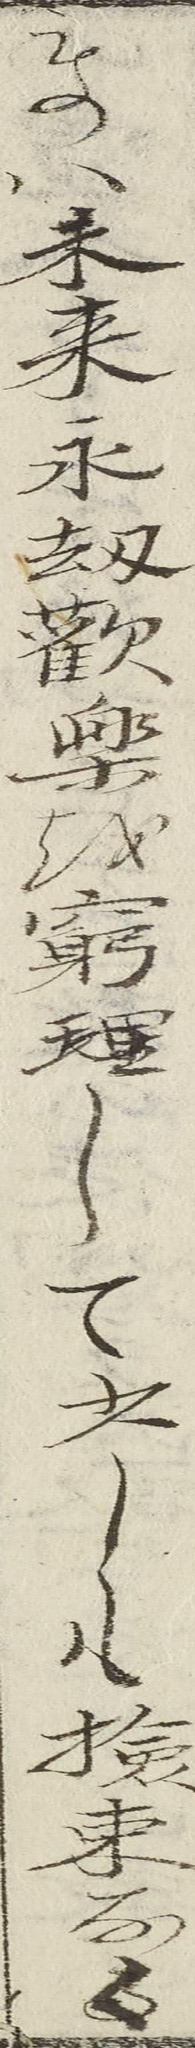ものハ未来永劫歓楽を窮理して少しも検束なく
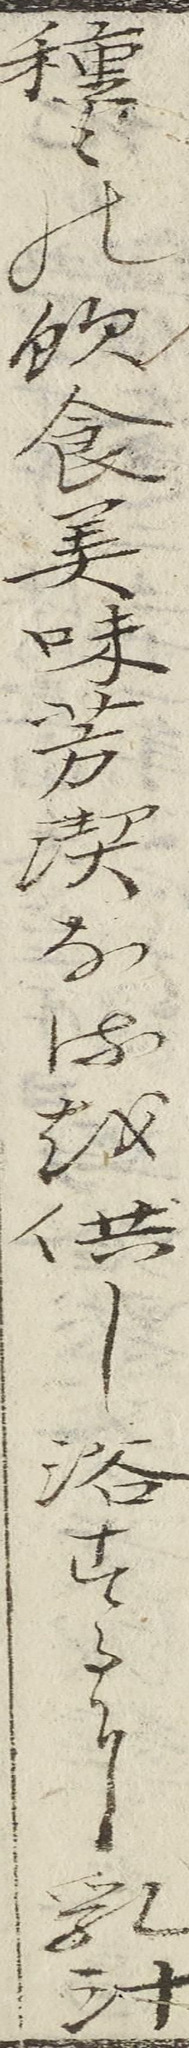種々の飲食美味芳偰なるを供し浴するに乳汁
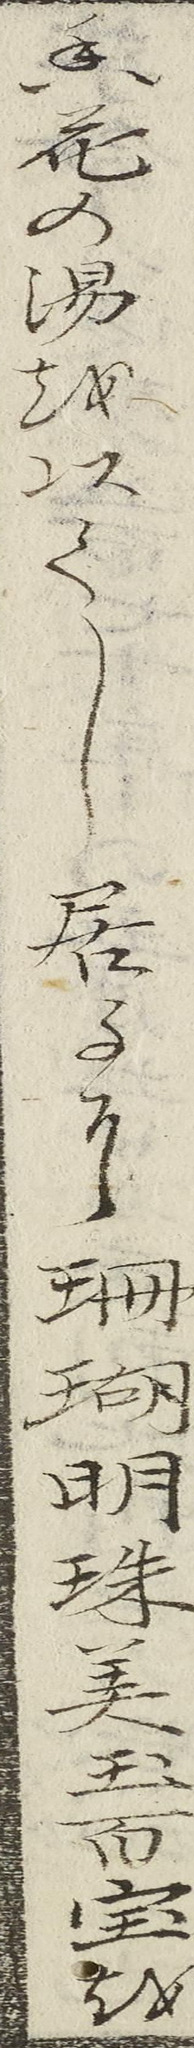美花の湯を以てし居るに珊瑚明珠美玉百宝を
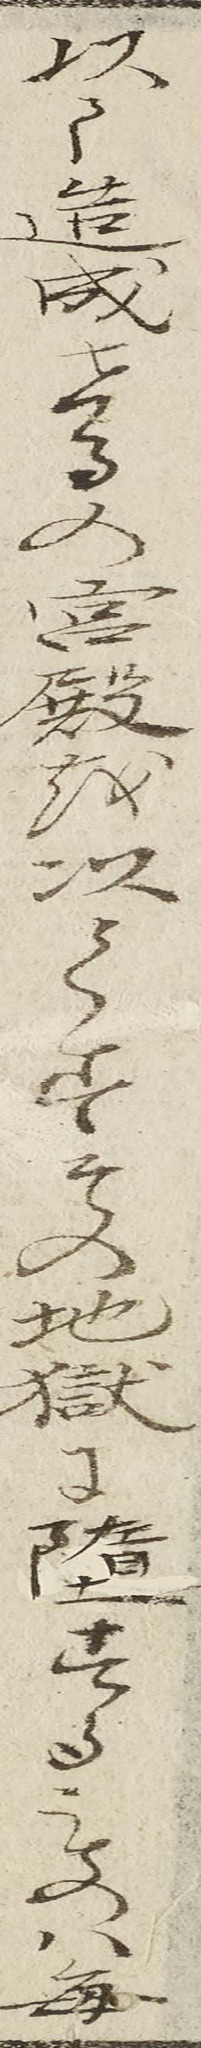以て造成するの宮殿を以てすその地獄に堕するものは毎
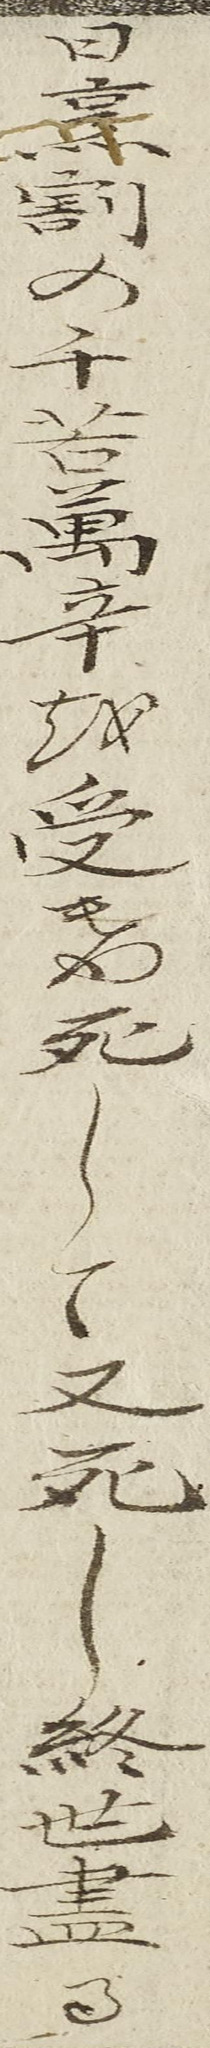日烹割の千苦萬辛を受け死して又死し終世盡る
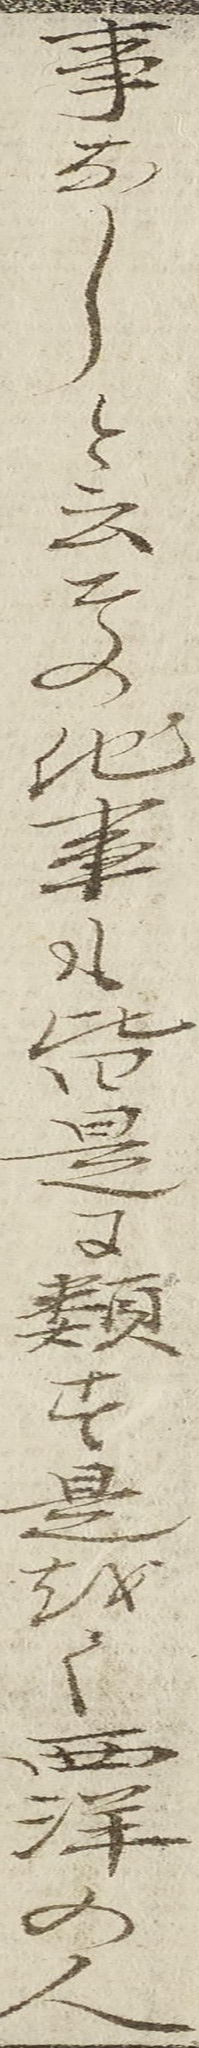事なしと云その他も皆是に類す是をて西洋の人
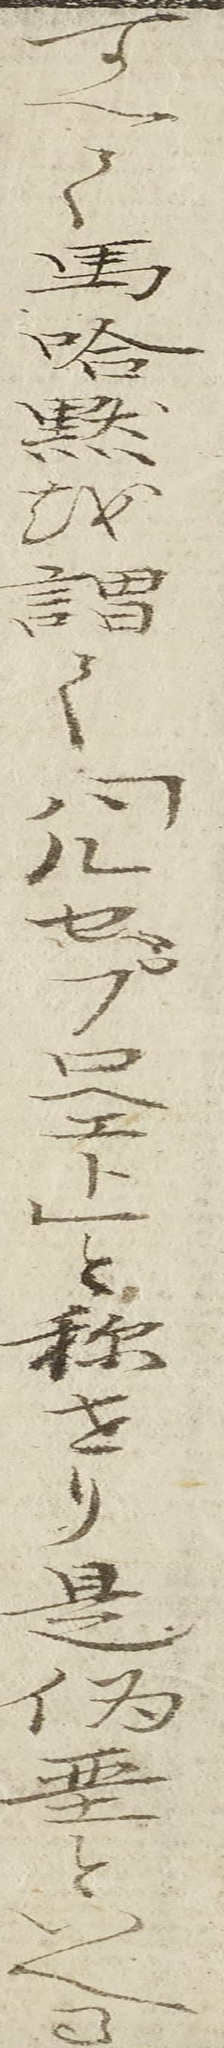すへて馬哈黙を謂て「ハルせ〃プロへエト」と称せり是偽堊といへる
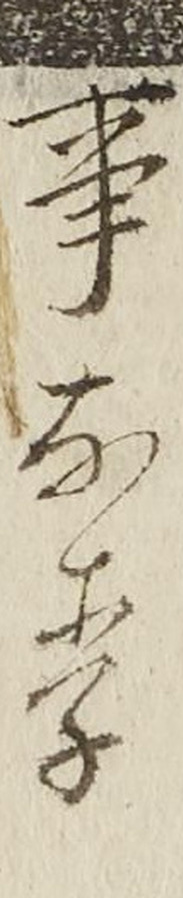事なり
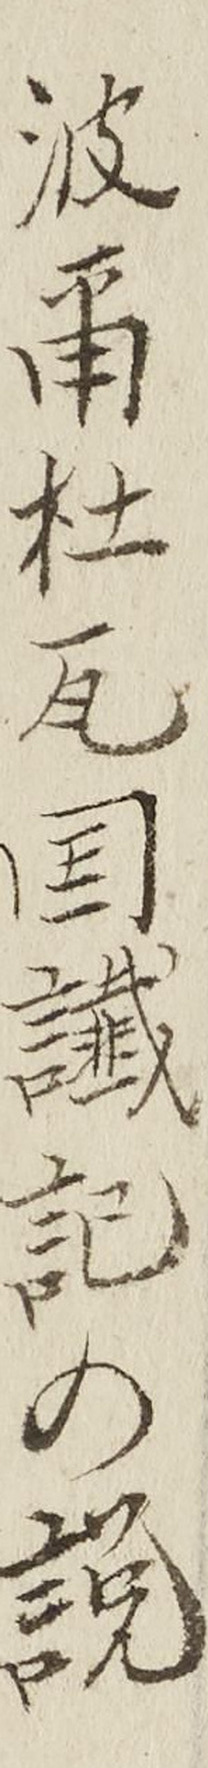波爾杜瓦国纎記の説
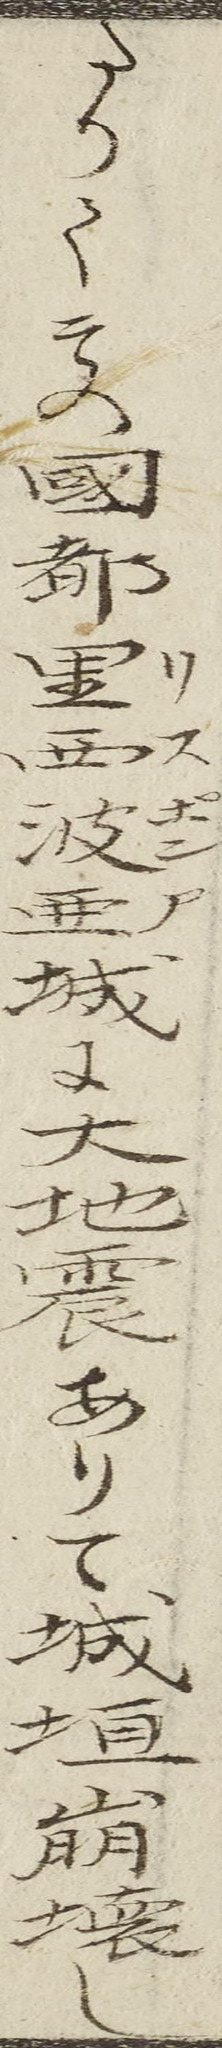たりてその国都里西波亜城に大地震ありて城垣崩壊し
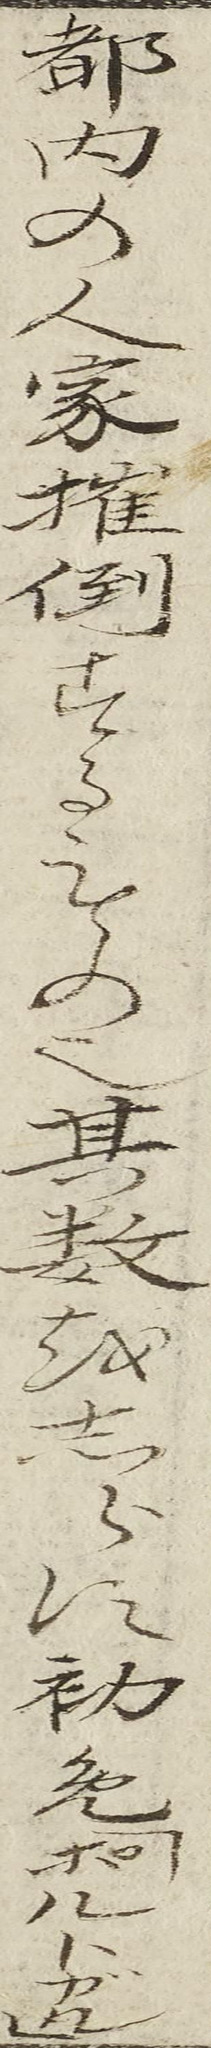都内の人家摧倒するもの其数をしらす初め「ポルトガル」
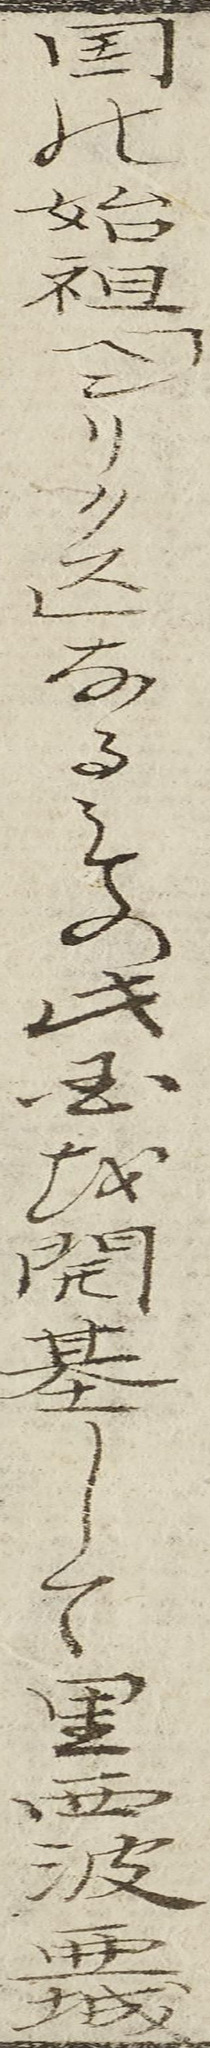国の始祖「ヘンリクス」なるもの此国を開基して里西波亜城
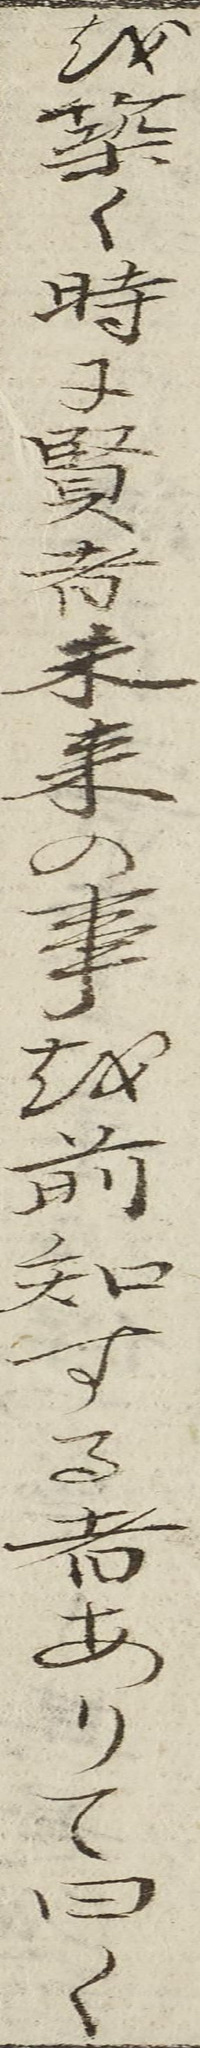を築く時に賢者未来の事を前知する者ありて曰く
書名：西洋雜記　坤
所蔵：東京大学地震研究所図書室 Earthquake Research Institute Library, The University of Tokyo, JAPAN
